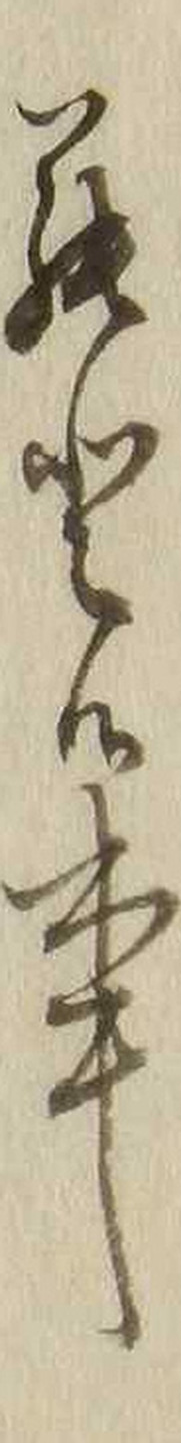罷登候事
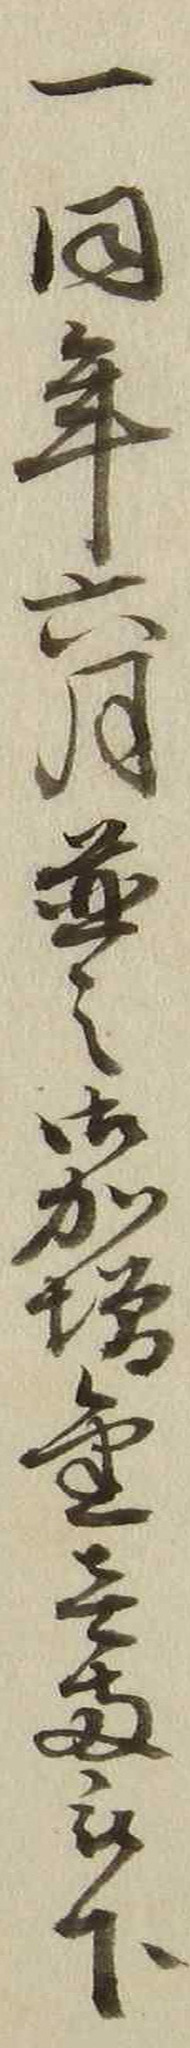一同年六月並之御加増金壱両被下
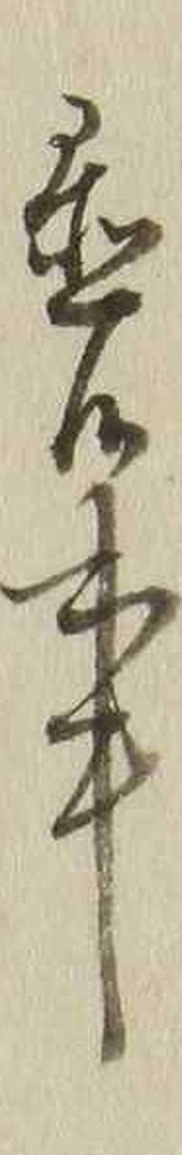置候事
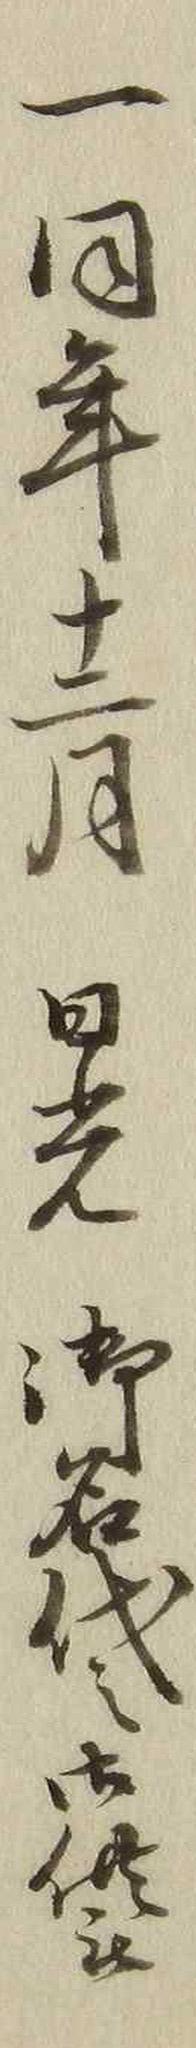一同年十二月日光御名代之御供被
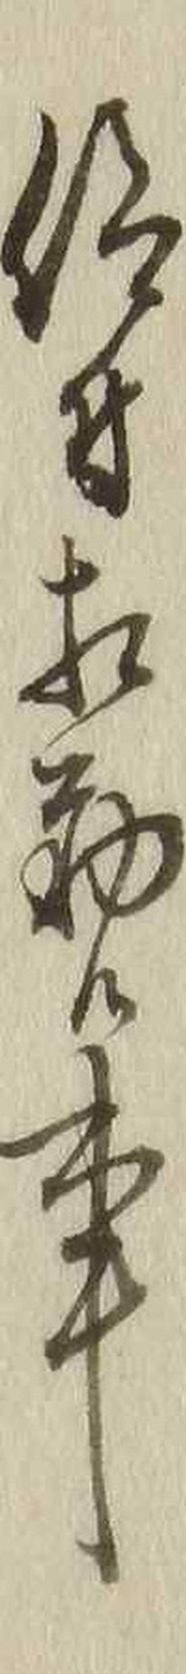仰付相勤候事
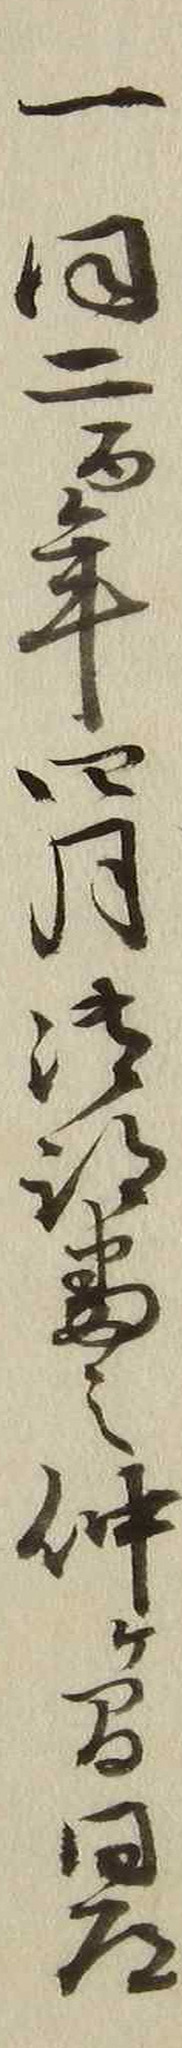一同二酉年四月御跡番之仲ケ間同道
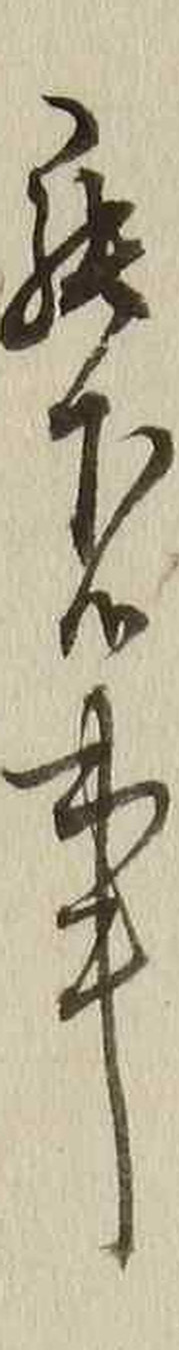罷下候事
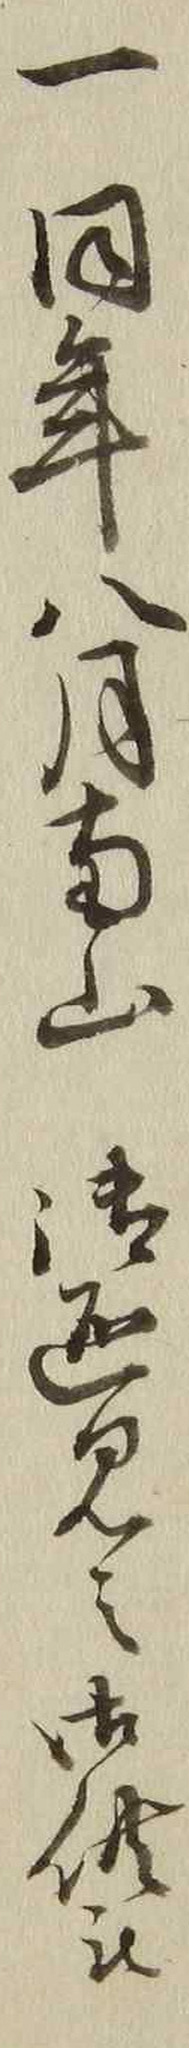一同年八月南山御巡見之御供被
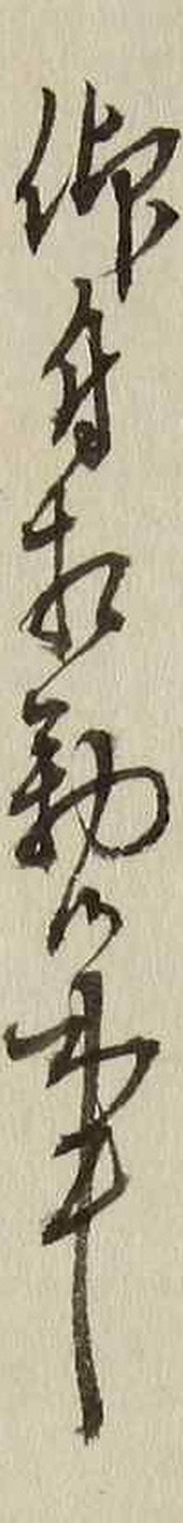仰付相勤候事
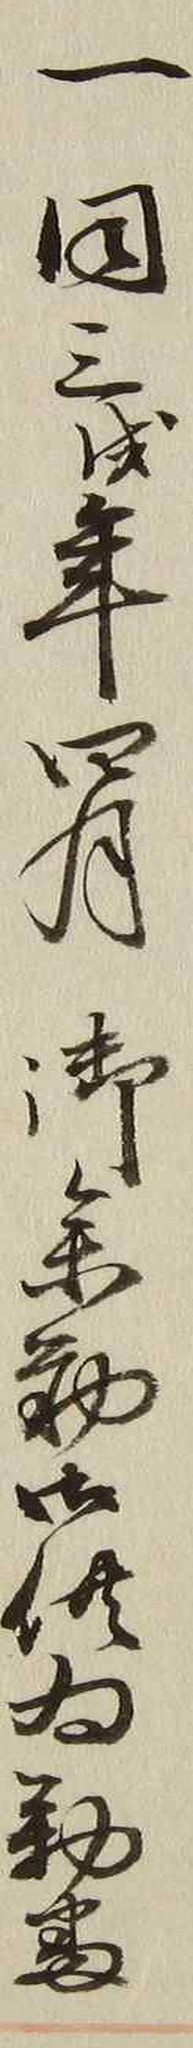一同三戌年四月御参勤御供為勤番
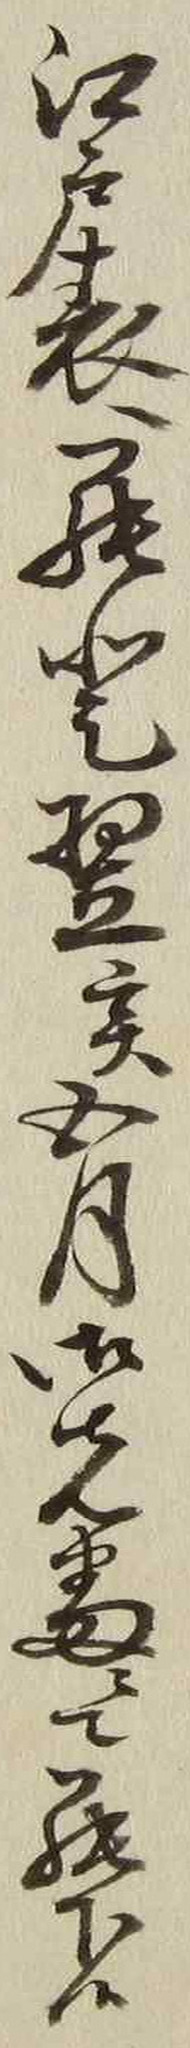江戸表罷へ罷登翌亥五月御先番ニて罷下候
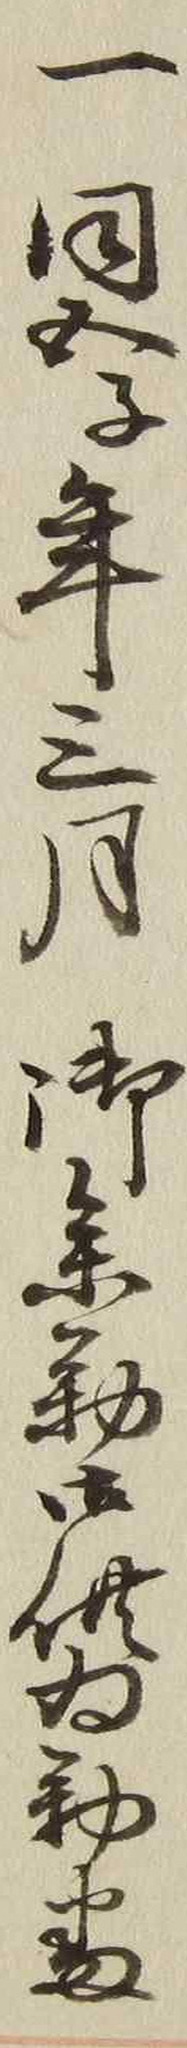一同五子年三月御参勤御供為勤番
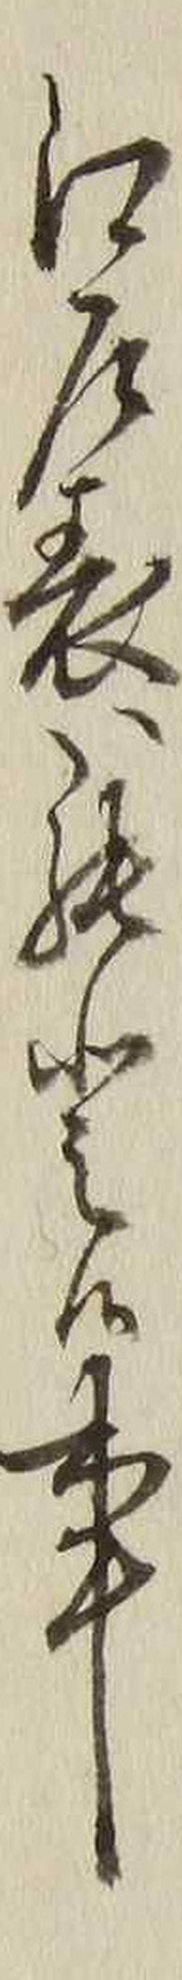江戸表へ罷登候事
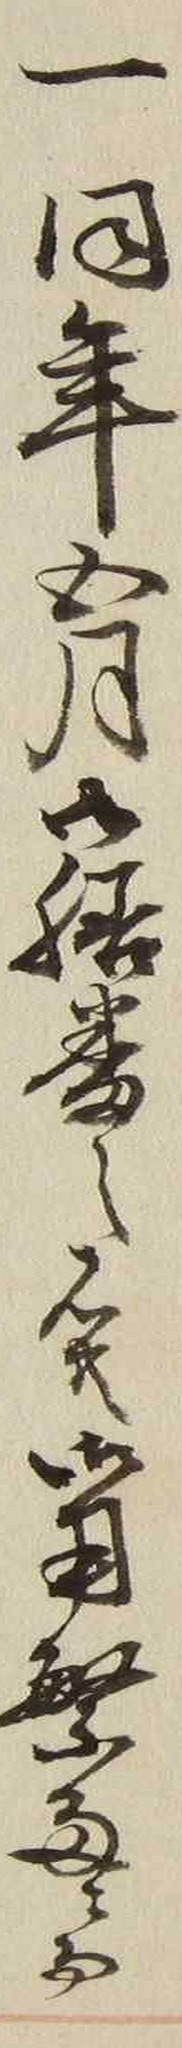一同年五月御膳番之者共御用繁多ニ而
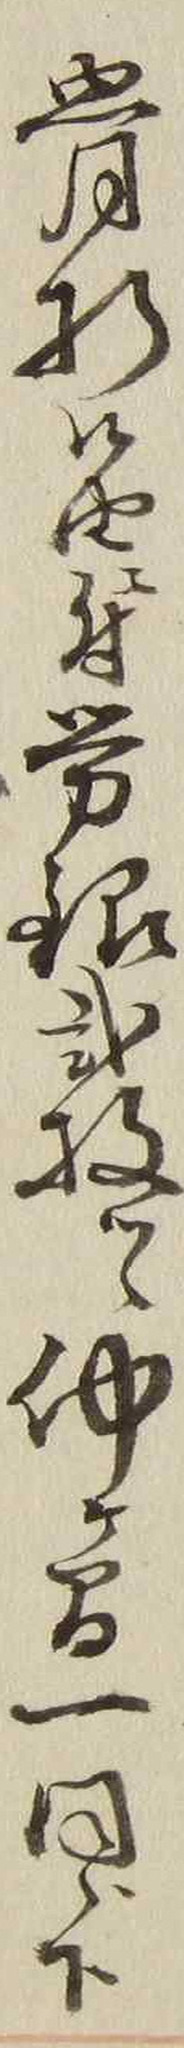骨折候由ニ付労銀弐枚ツヽ仲ケ間一同被下
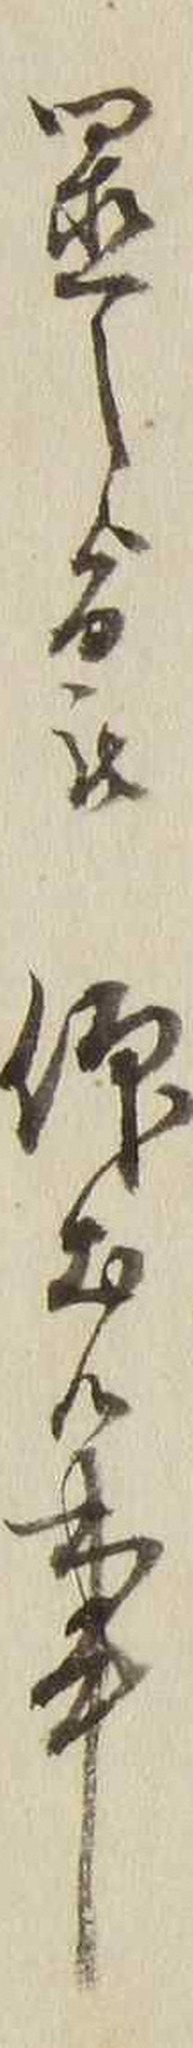置之旨被仰出候事
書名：諸士系譜　巻之23　い之部23
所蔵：会津若松市立会津図書館
